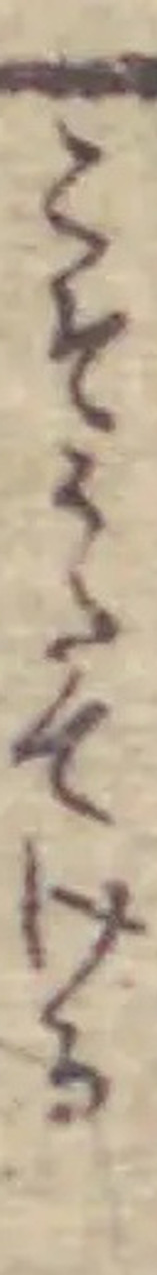こそうたてける
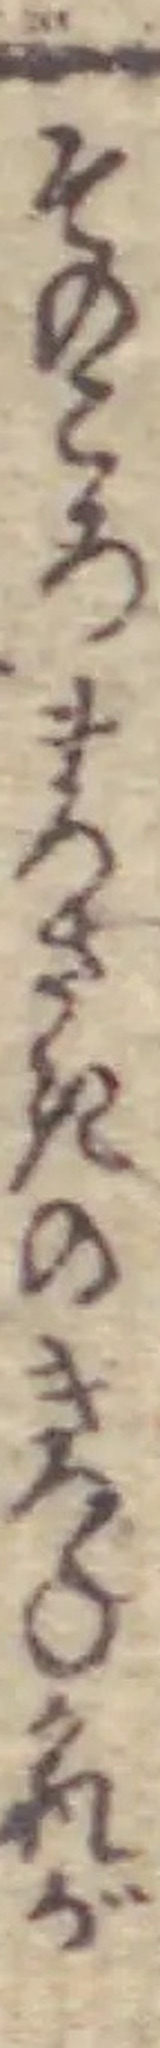そのころまつさきのきつねかれが
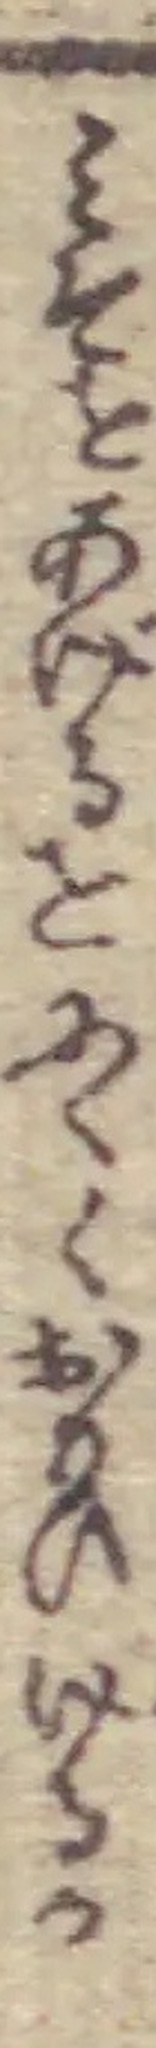みそをあげるをにくくおもひけるか
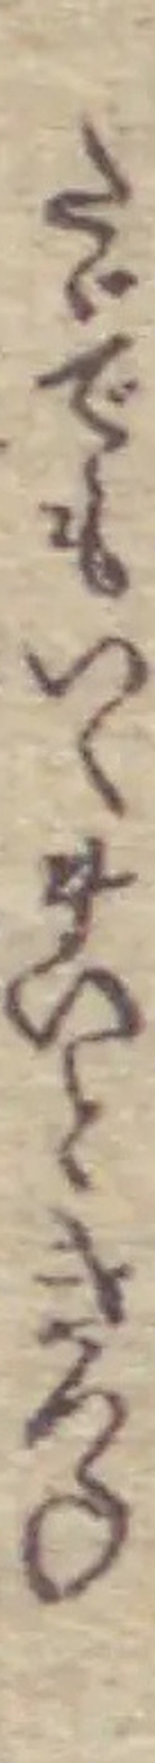たゞでもいくまいときつね
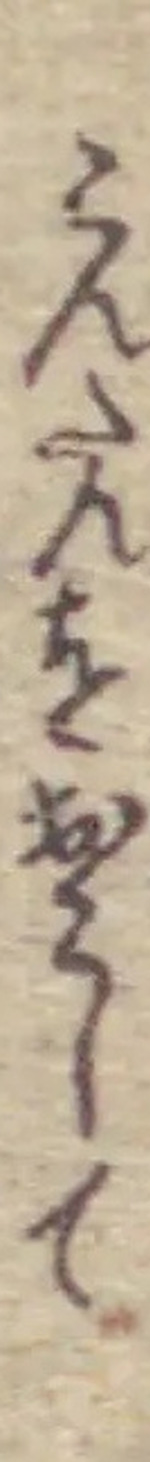こんたんをおこして
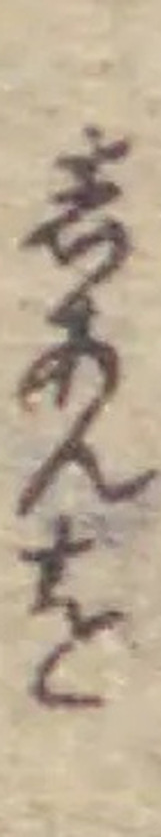しあんを
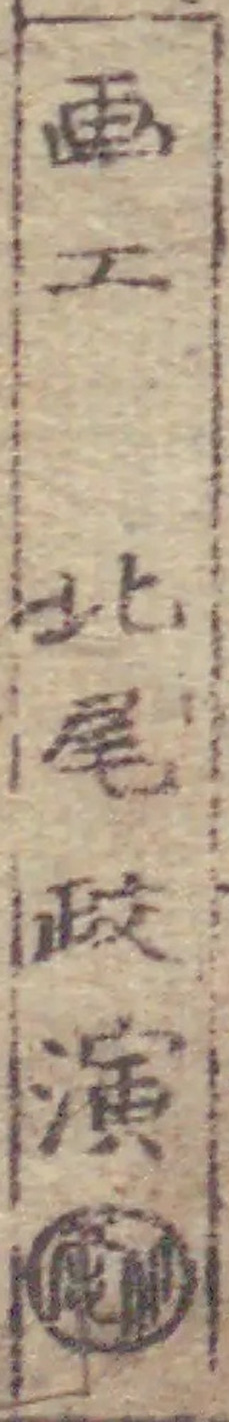画工北尾政演

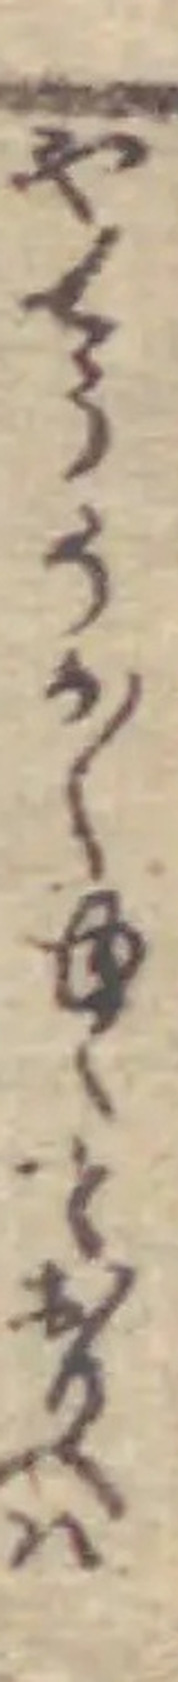やてううか〳〵ゆくとおもへは
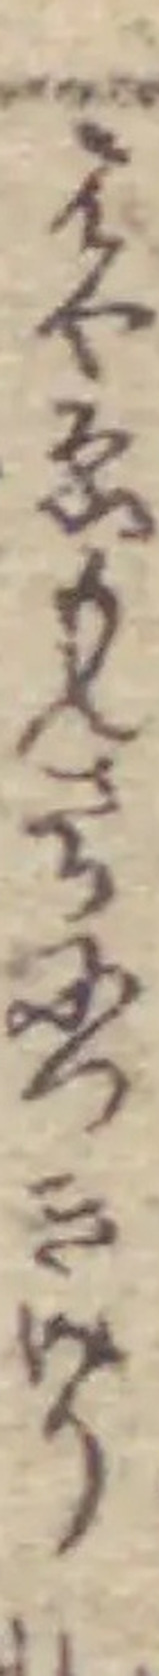はやゑもんさかにつきけり
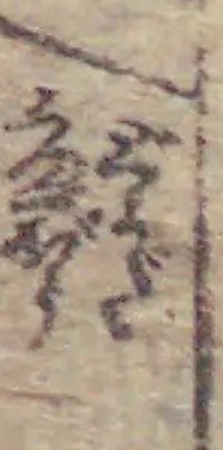くまぼう
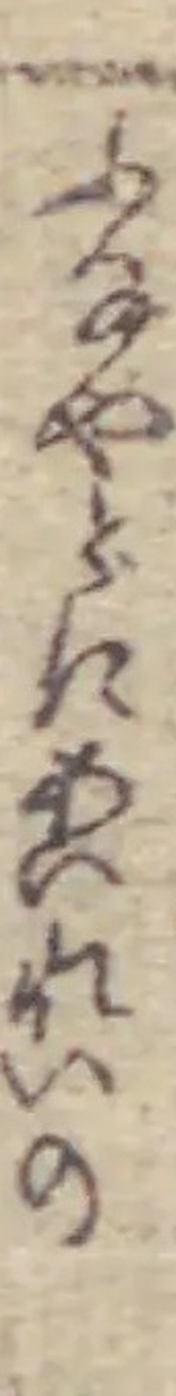ふなやどにあいれいの
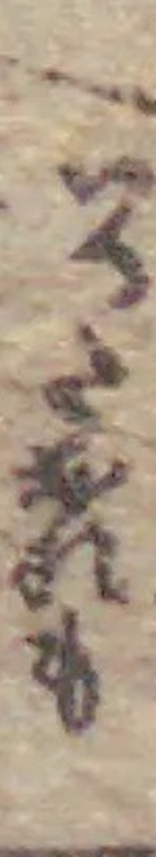いつたおれも
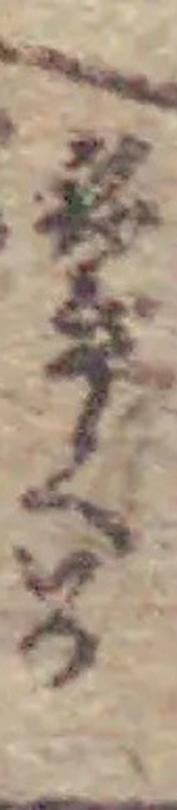ねぎしへいつ
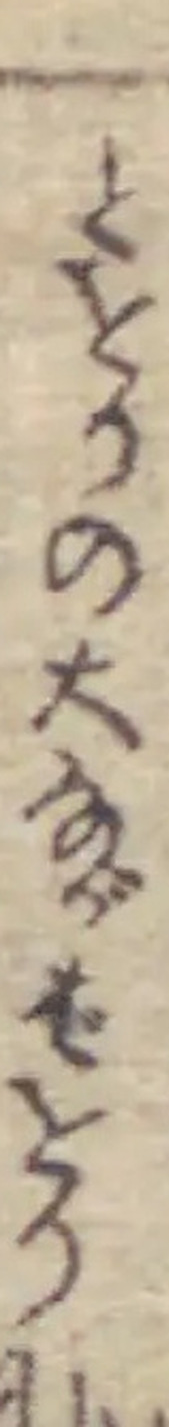とをりの大ながばをり
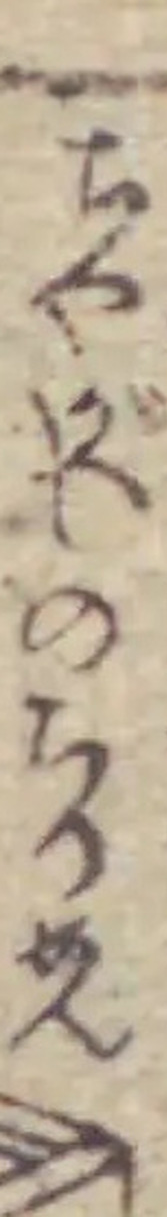ちやがへしのちりめん
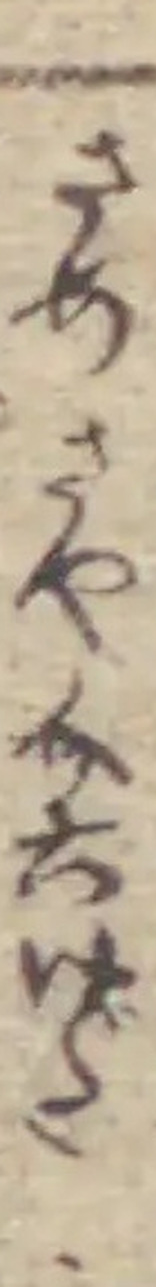さめさや介六げた
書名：夜野中狐物 2巻
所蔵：国立国会図書館 National Diet Library, JAPAN
